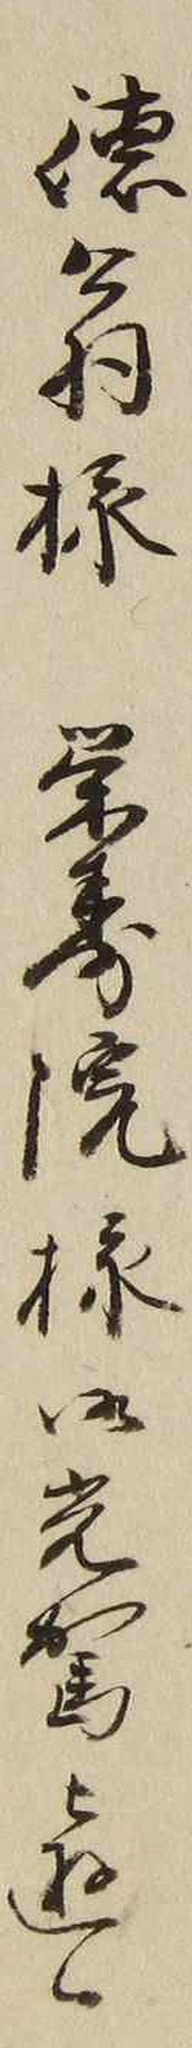徳翁様栄寿院様御光駕被遊候
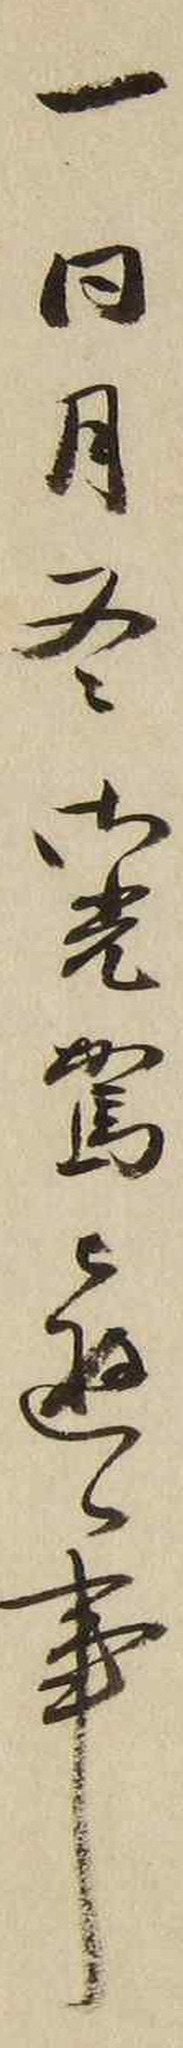一同月又々御光駕被遊候事

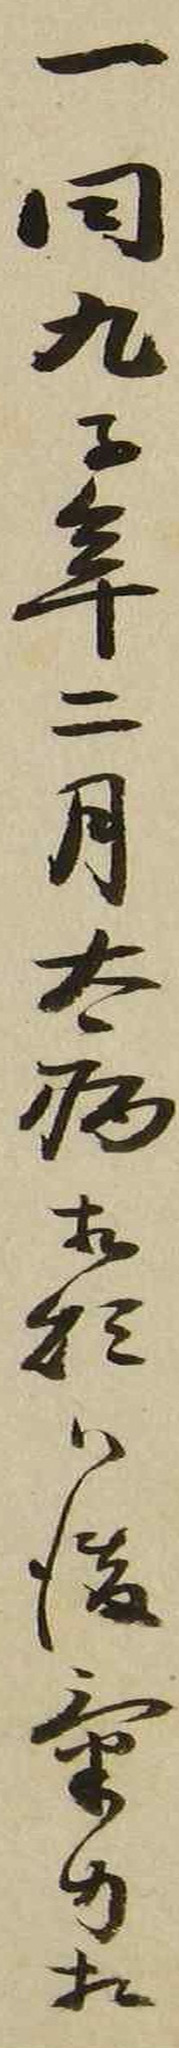一同九子年二月大病相煩以後気力相
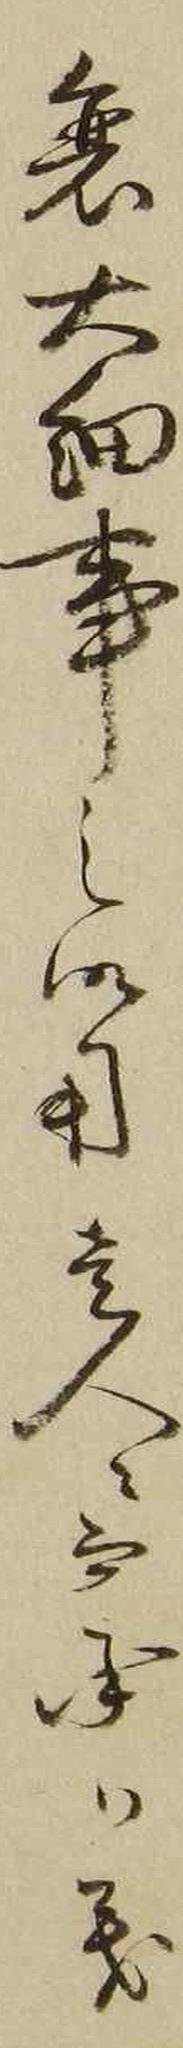悪大細事之御用壱人に而承候義
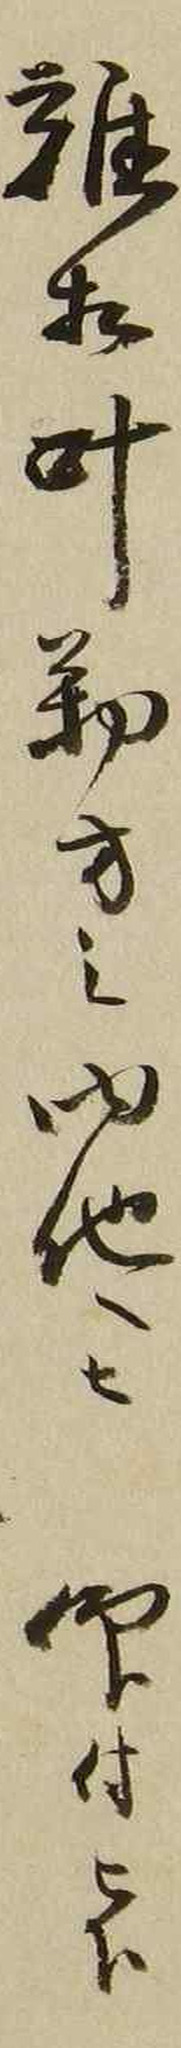難相叶勤方之内他へ被仰付被下
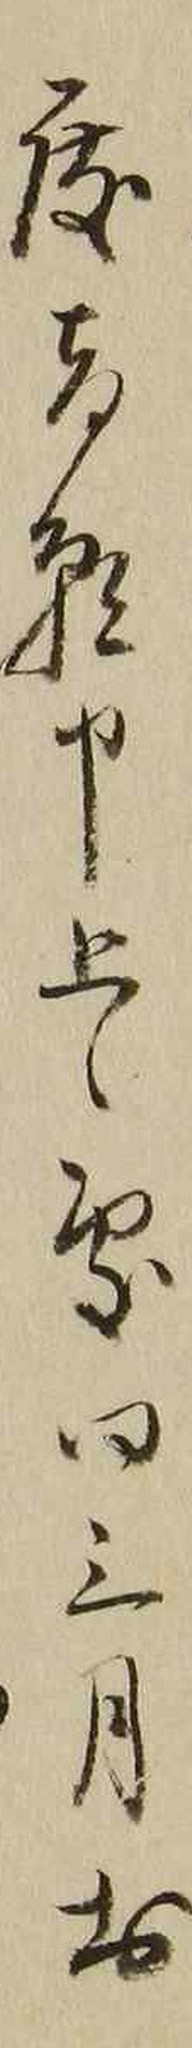度旨願申上候処同三月於
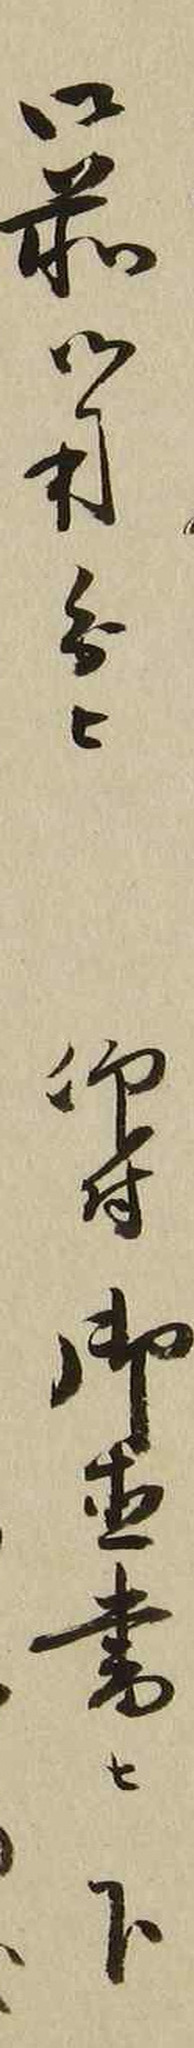御前御用分被仰付御直書被下
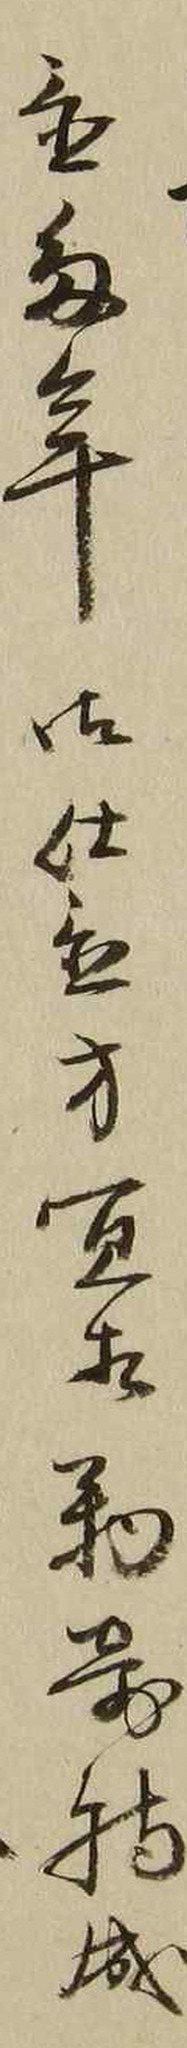置多年御仕置方宜相勤奇特成
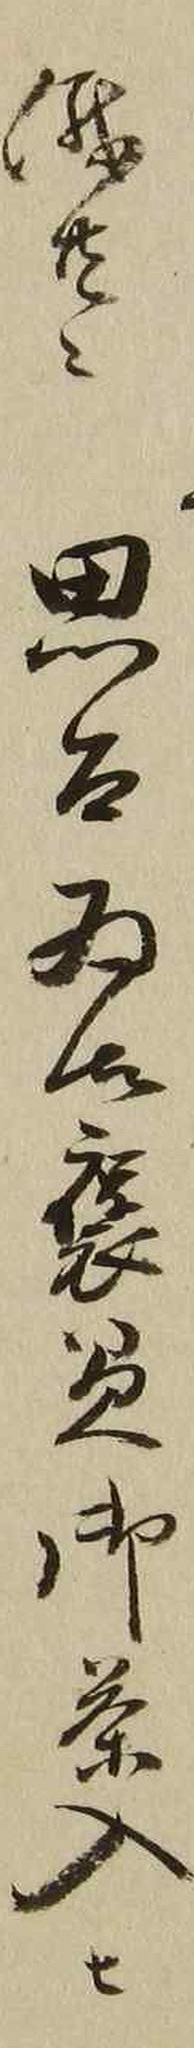儀共被思召為御褒美御茶入被
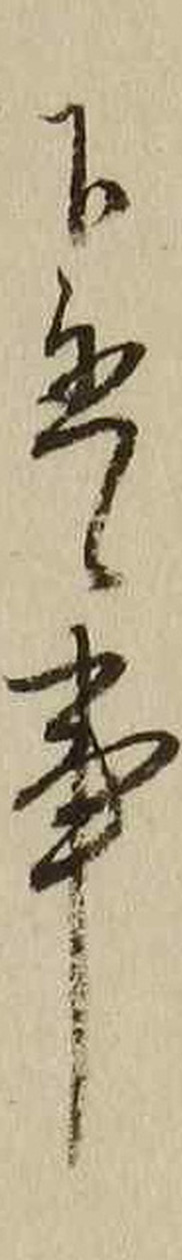下置候事
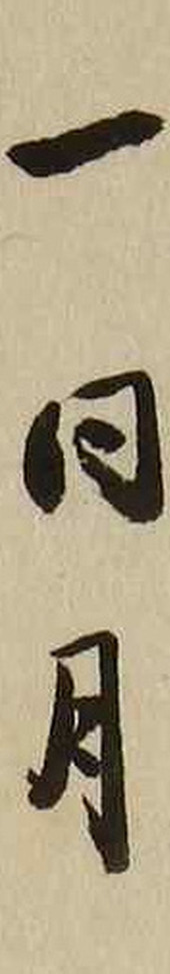一同月
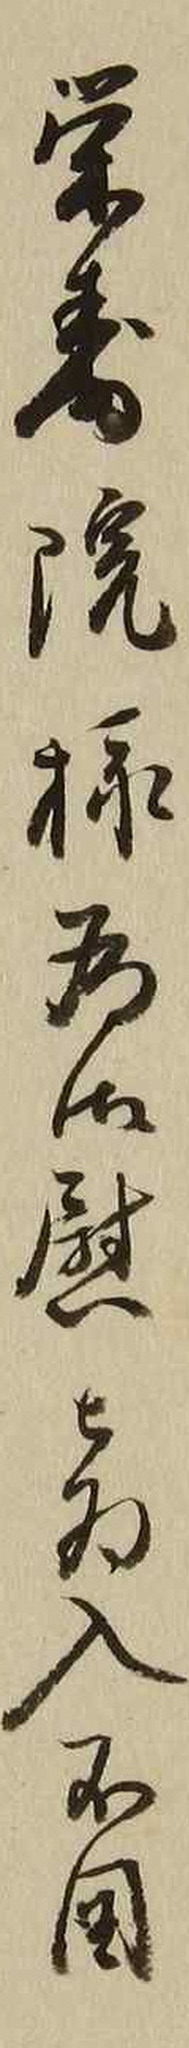栄寿院様為御慰被為入不用
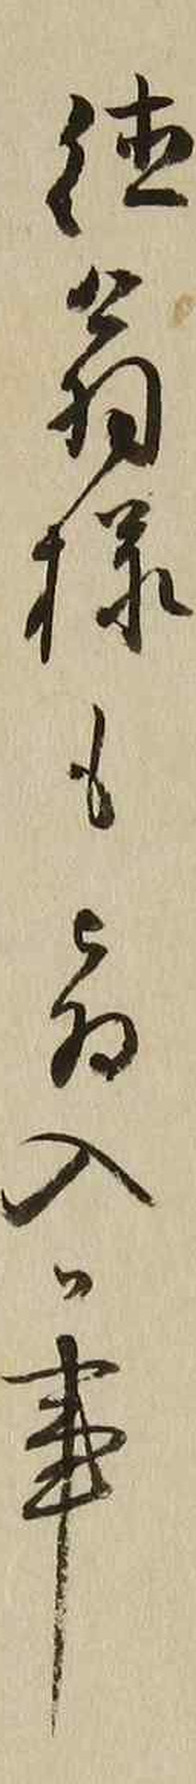徳翁様も被為入候事
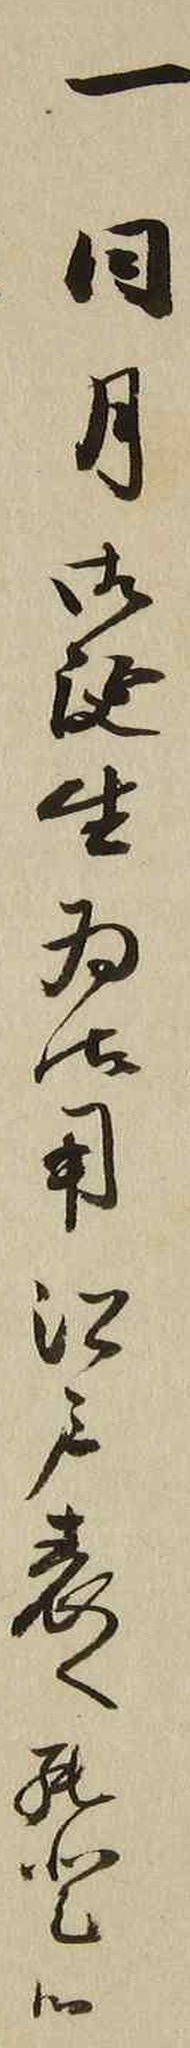一同月御誕生為御用江戸表へ罷登候
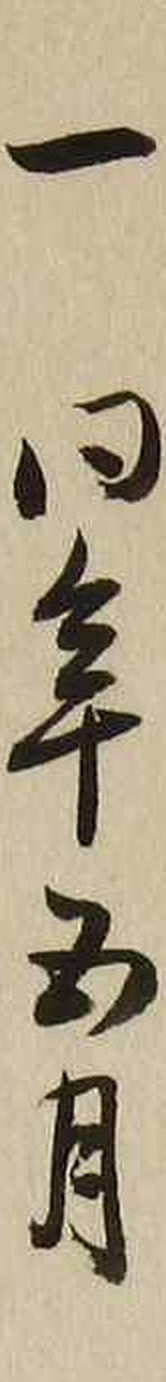一同年五月
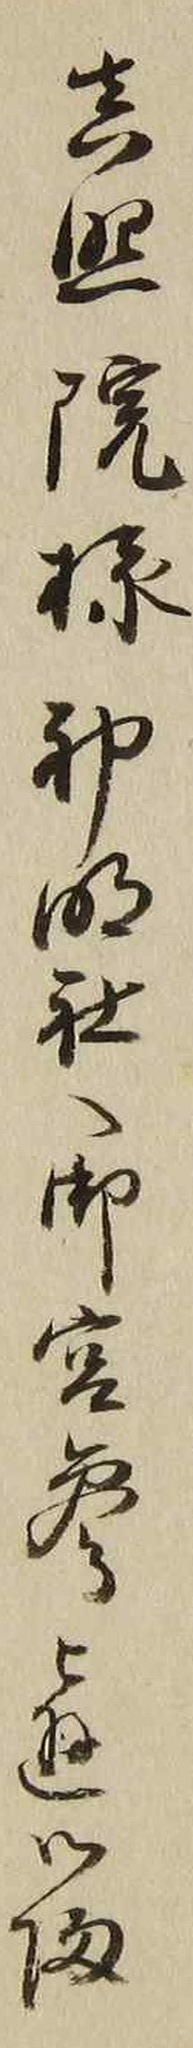真照院様明神社へ御宮参被遊御帰
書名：諸士系譜　巻之269　さ之部1
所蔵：会津若松市立会津図書館
